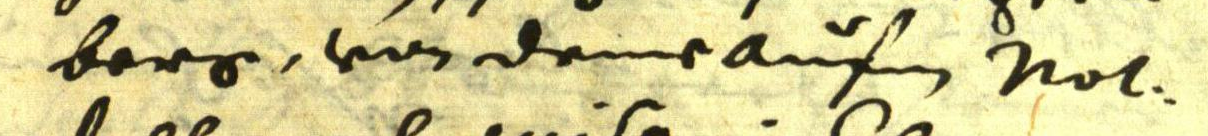berg, von deme aūfm Not¬
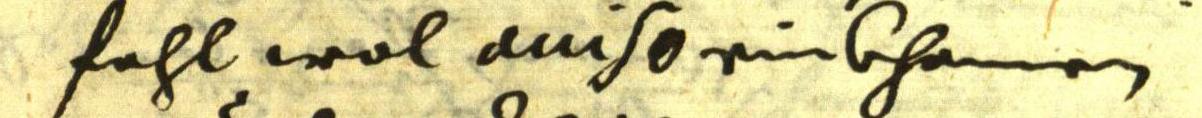fahl wol auiso einkhomen
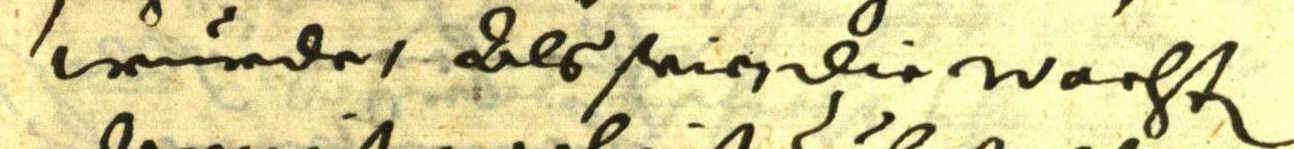wūrde, Als seien die Wacht
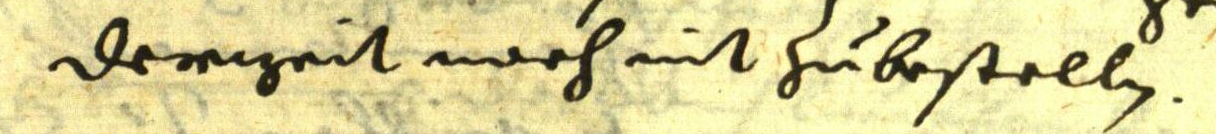derzeit noch nit Zūbestelln.
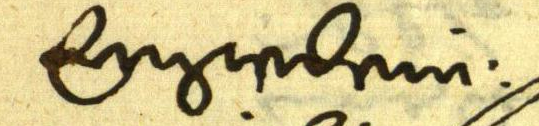Engedein¬
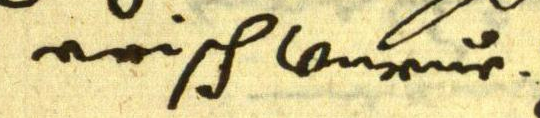erisch Vnrūe.
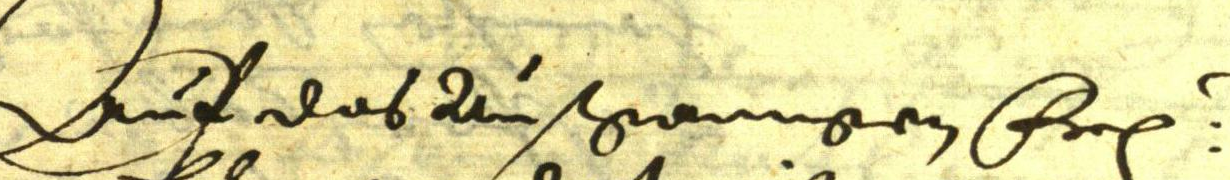Aūf das Aūsganngen Frl:
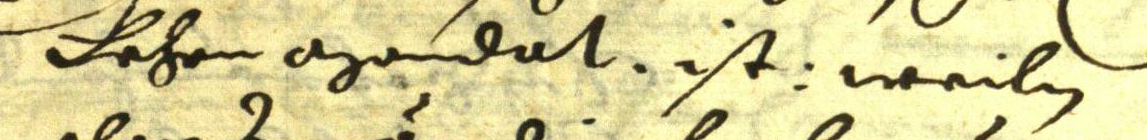Lehen Mandat. ist: weiln
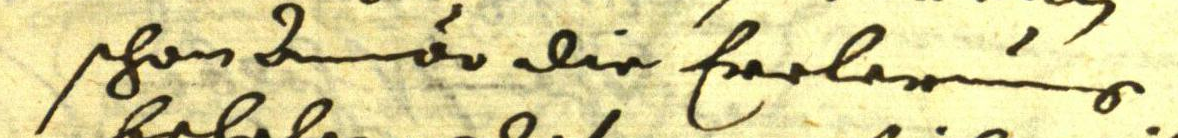schon Anūor die Erclerūng
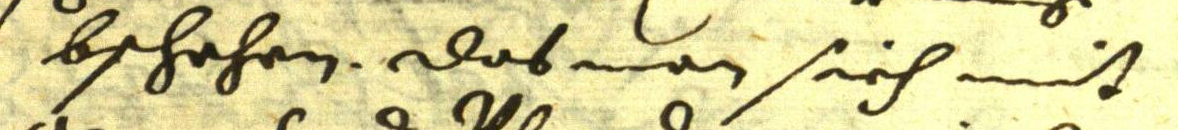bschehen. das man sich mit
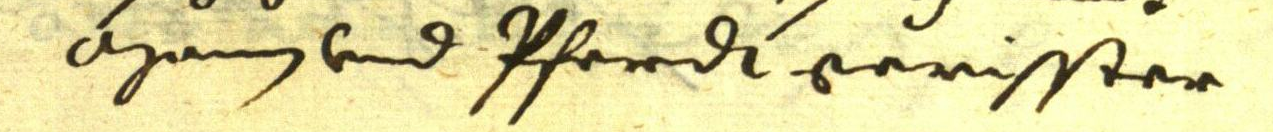Mann vnd Pferdt gerisster
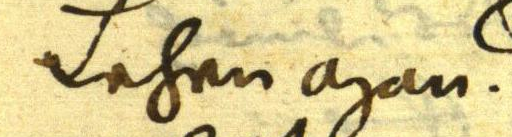Lehen Man¬
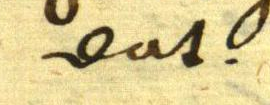dat.
